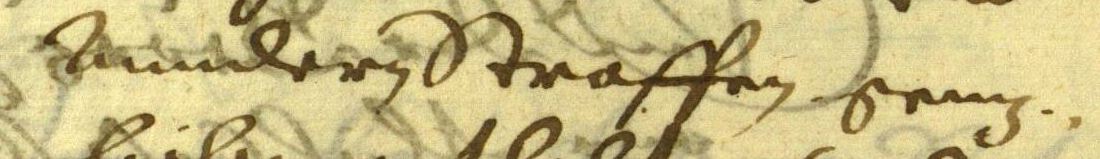Anndern Straffen genz¬
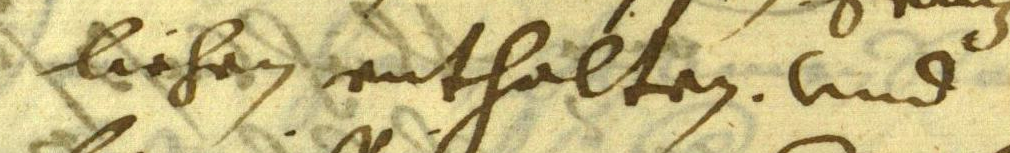lichen enthalten. vnd
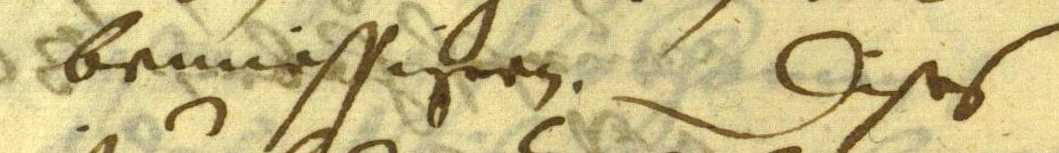bemiessigen. Dises
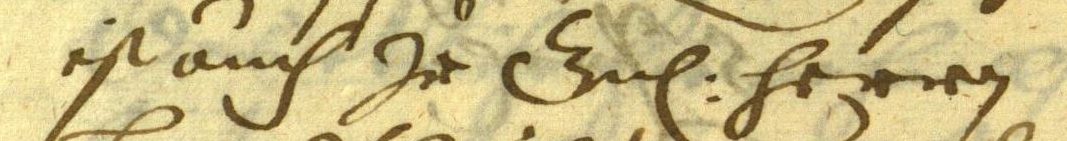ist aūch Ir Gn: herrn
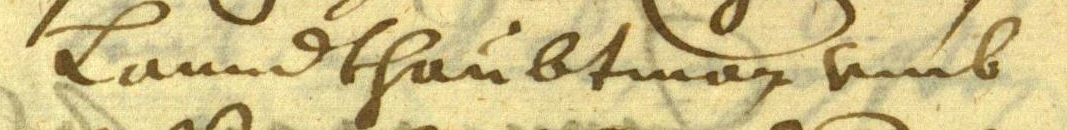Lanndthaūbtman vmb
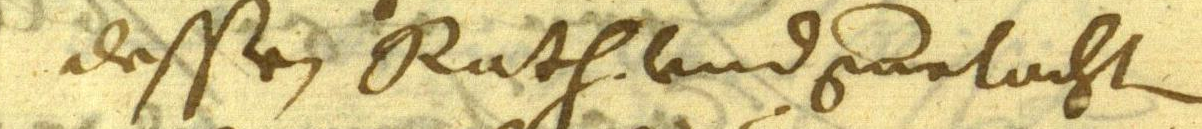dessen Rath. vnd gūetacht
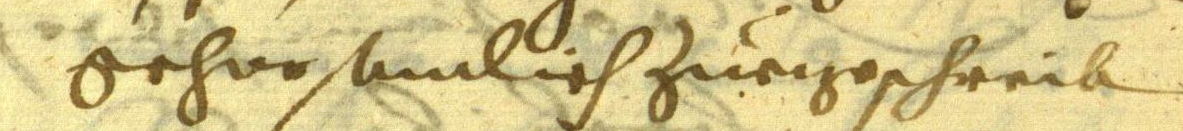gehorsamlich Zūezeschreib.
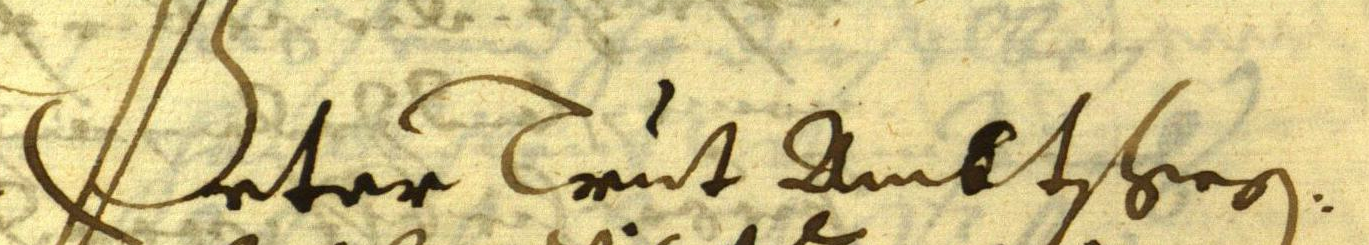Peter Trūt Ambtsgeg¬
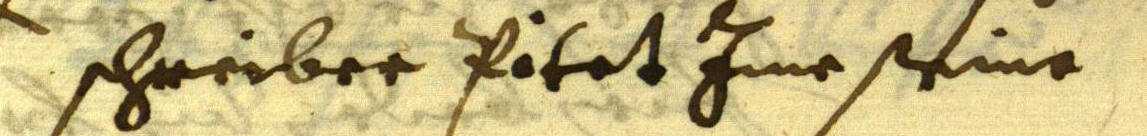schreiber Pitet Ime seine
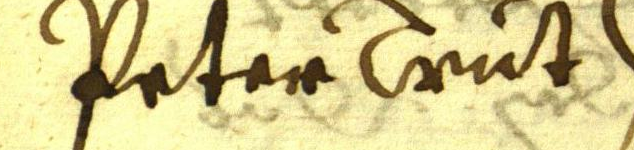Peter Trūt
